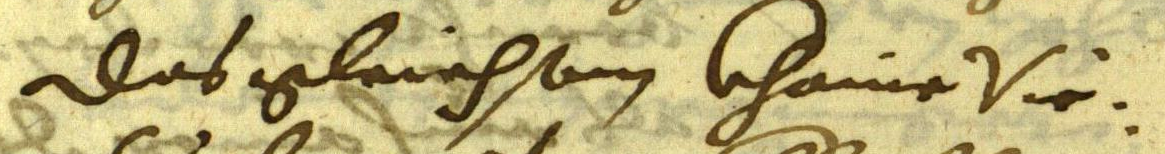das gleichsam khaine Vic¬
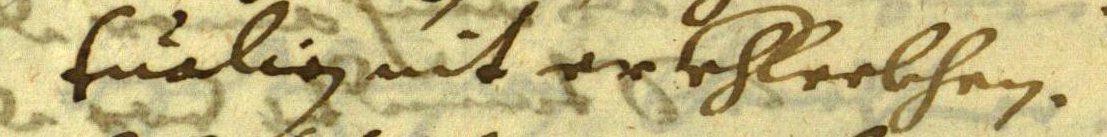tūalien nit erkhleckhen.
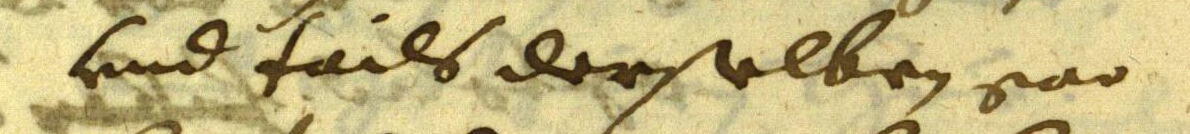vnd tails derselben gar
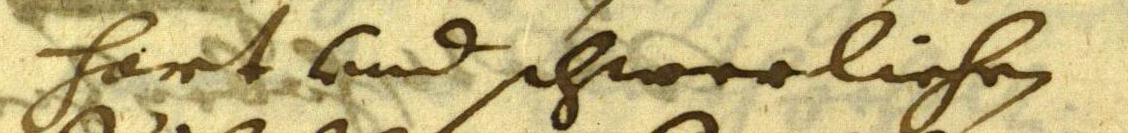hart vnd schwerlichen
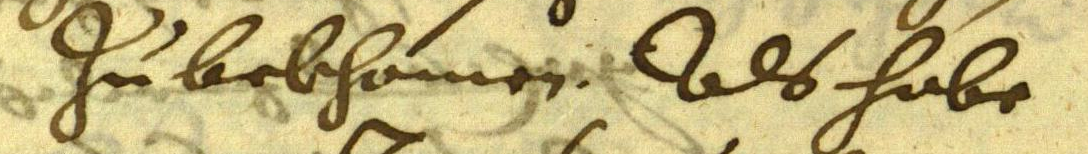Zū bekhomen. Als habe
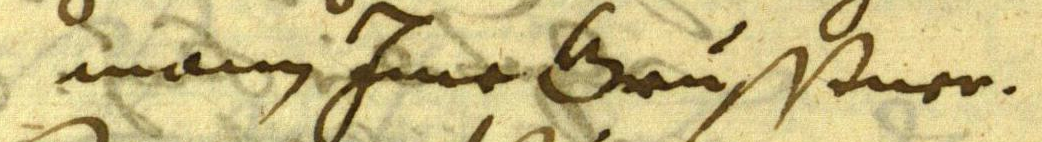mann Ime Grūsstner.
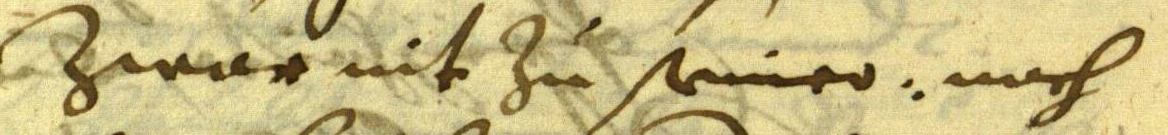Zwar nit Zū seiner: noch
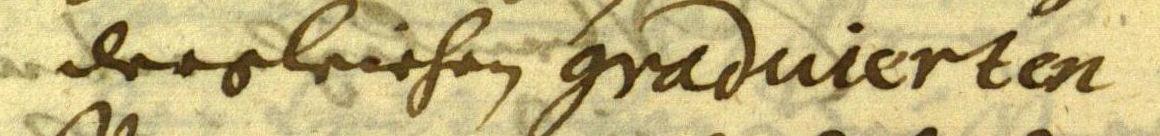dergleichen graduierten
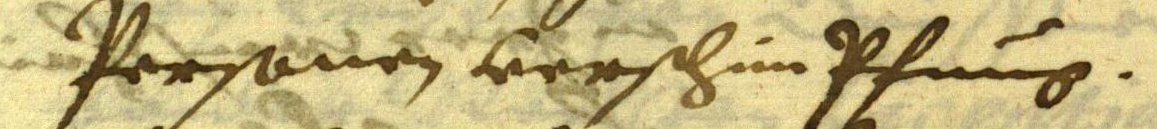Personen verschimPfūng.
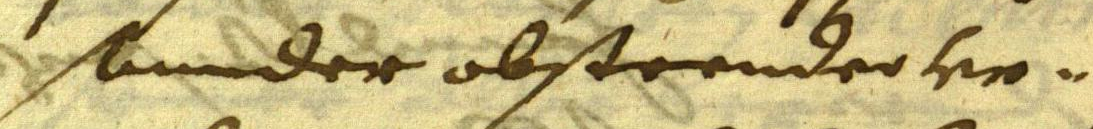sonnder obsteender vr¬
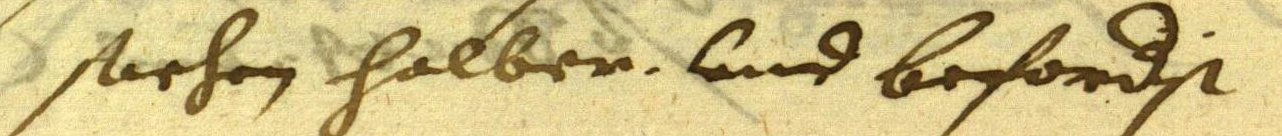sachen halber. vnd befordist
